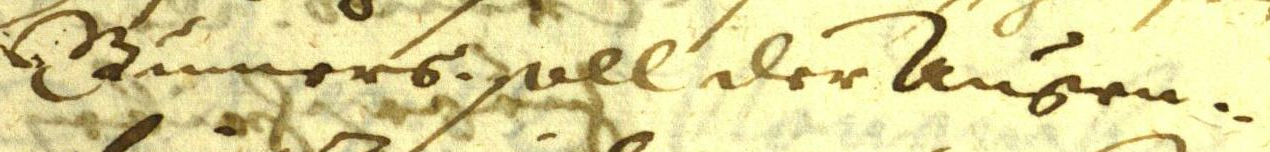Gūmers. soll der Aūgen¬
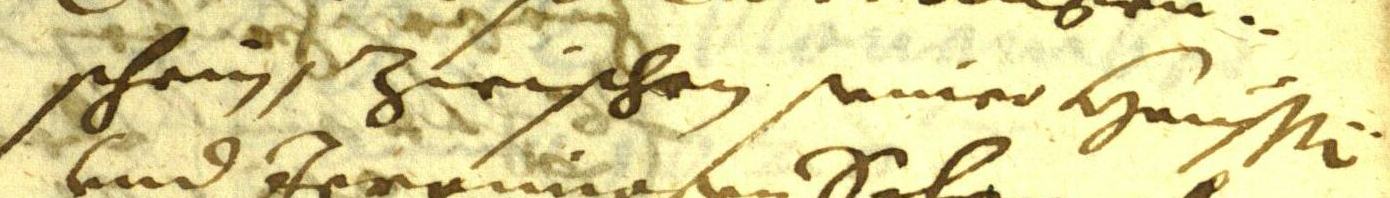schein Zwischen seiner Heūss
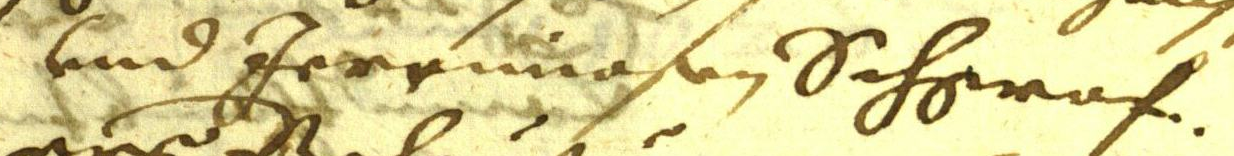vnd Jeronimosen Schgraf¬
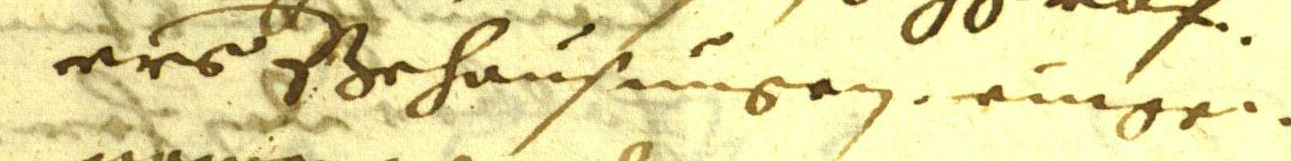ers Behaūsūngen. einge¬
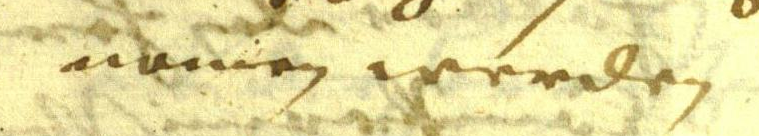nomen werden
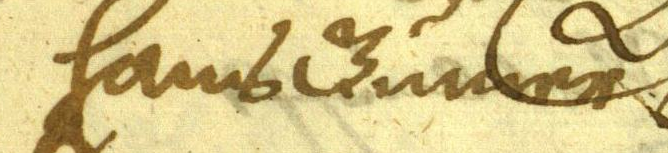hans Gūmer
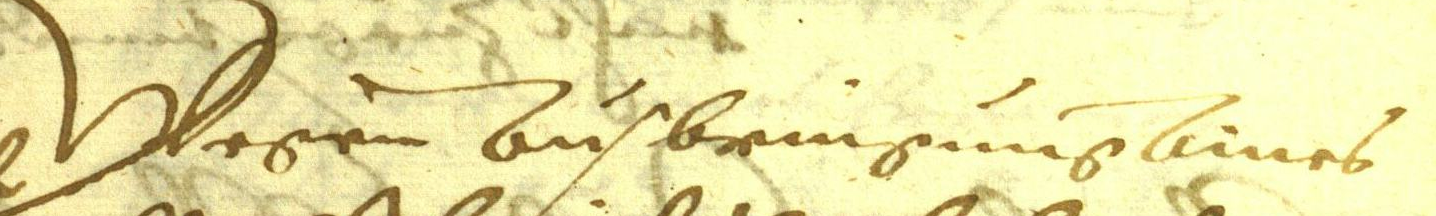Wegen Aūsbringūng Aines
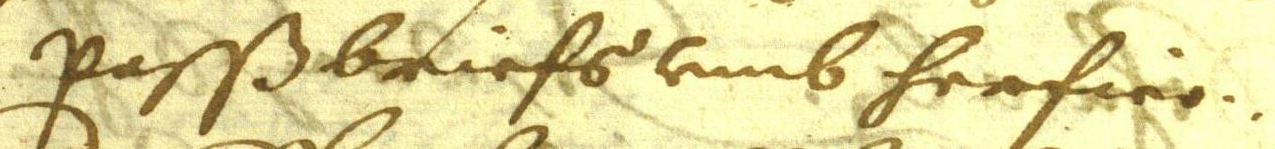Pasßbriefs vmb herfier¬
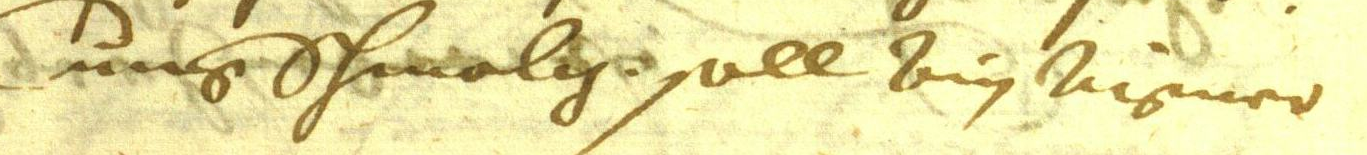ūng Schmalz. soll Ain Aigner
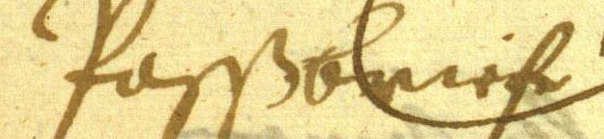Pasßbrief
